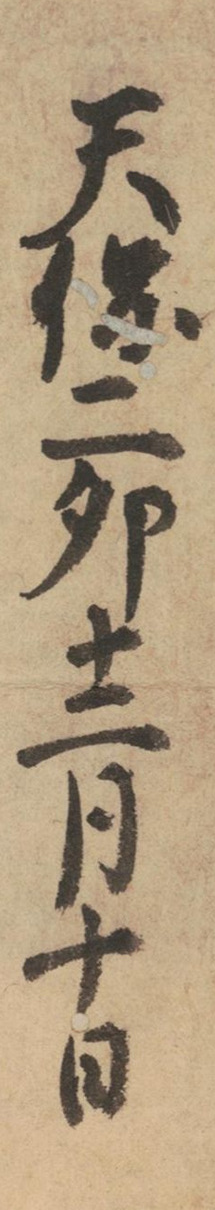天保二卯十二月十二日
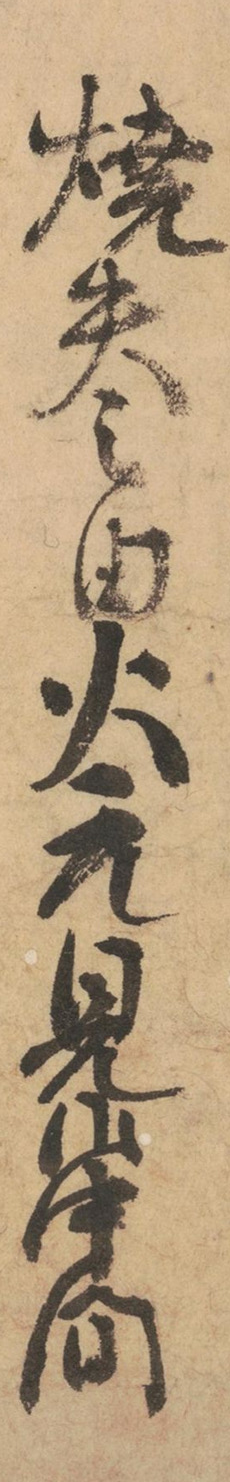焼失之由火元見御中間
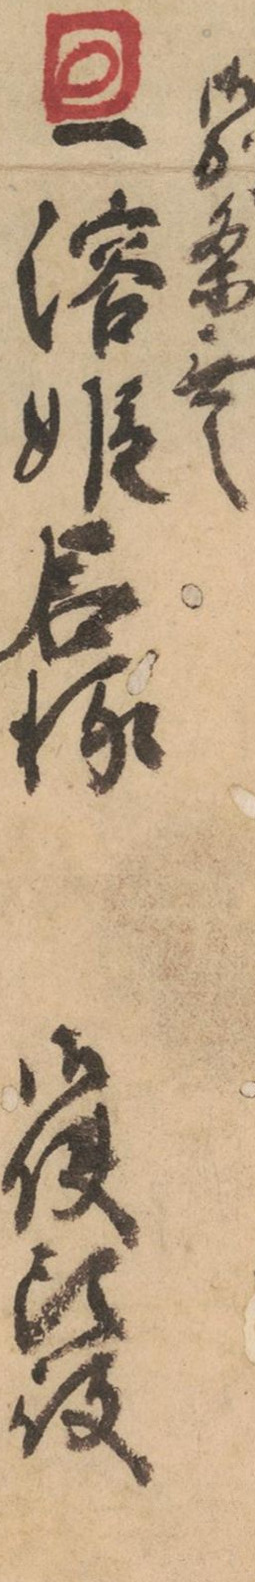一溶姫君様御使頭役
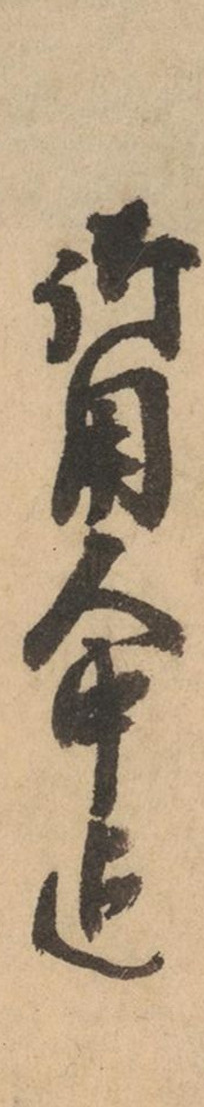御用人中迄
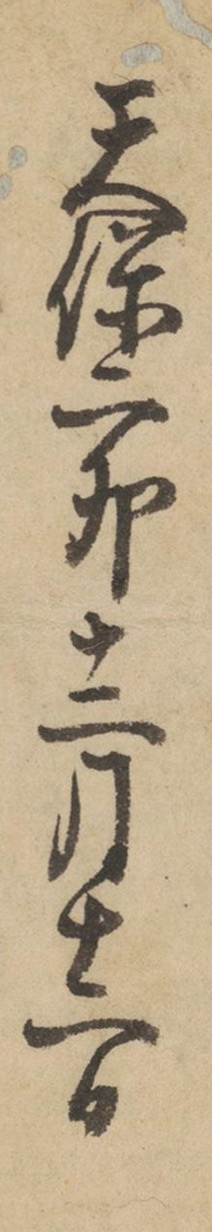天保二卯十二月十二日
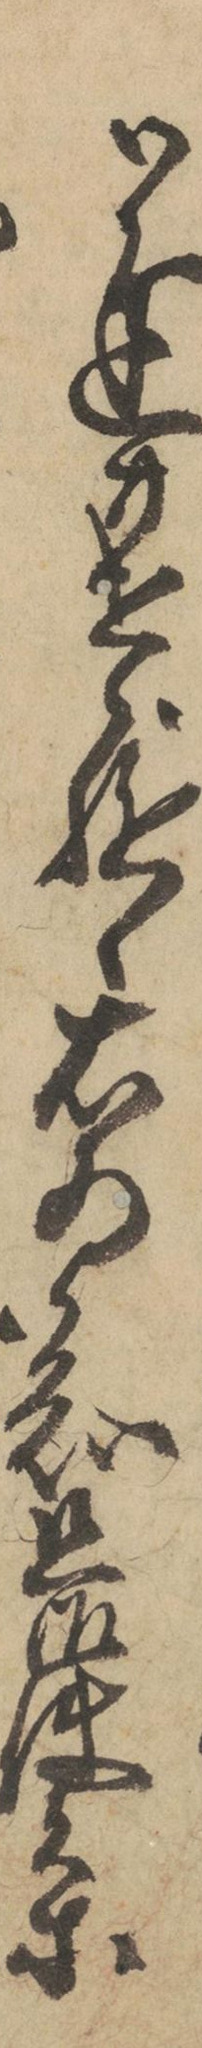御達方を被遊候右為御知且御使者等
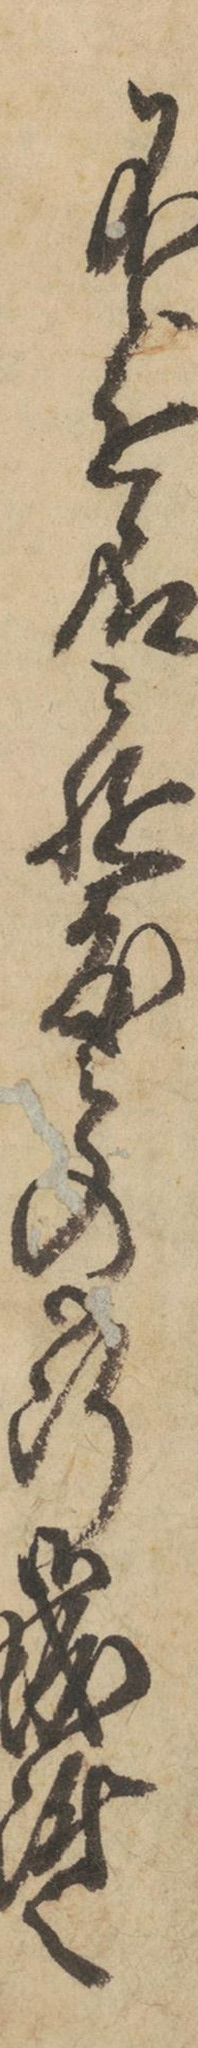不被進候様被遊度との御断御城附之
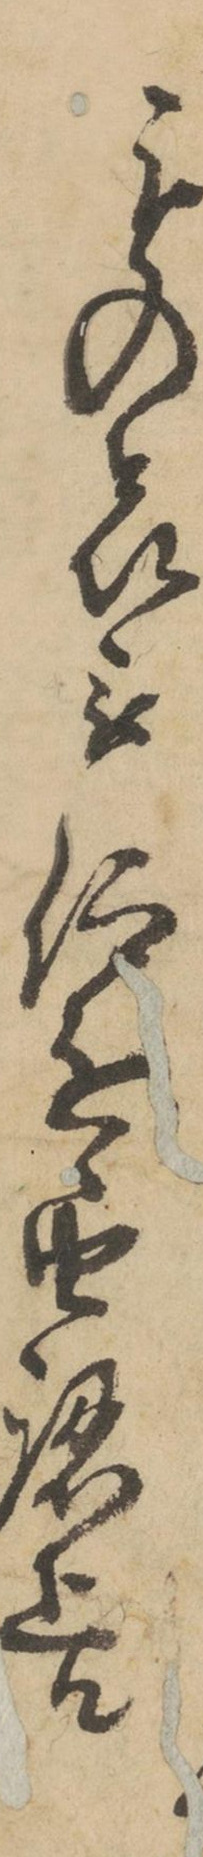ものを以被仰進候由認上ㇽ
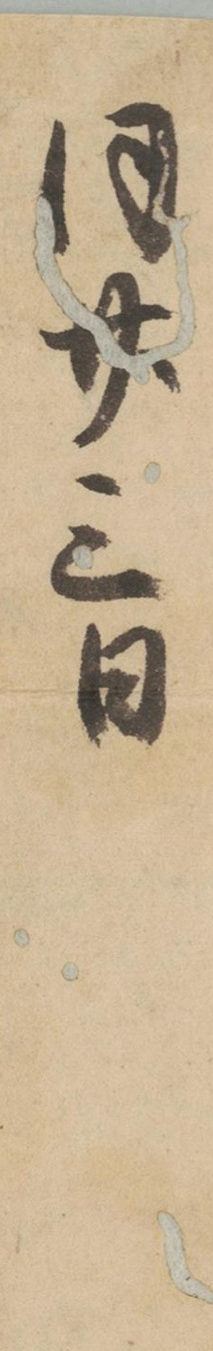同廿三日
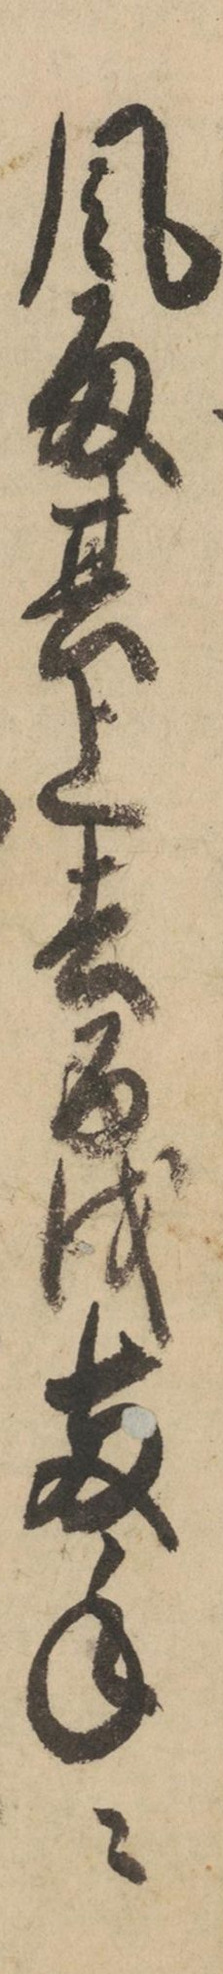風雨其上去酉戌両年に
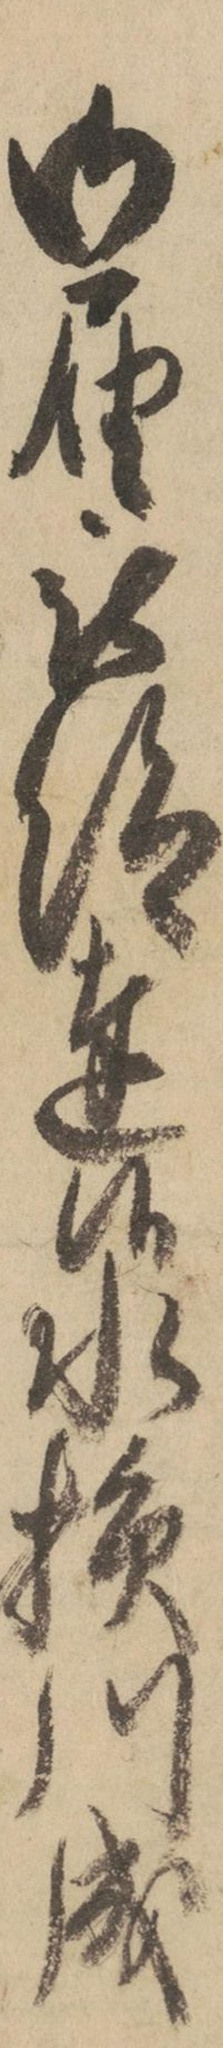御届被仰達候水損川儀
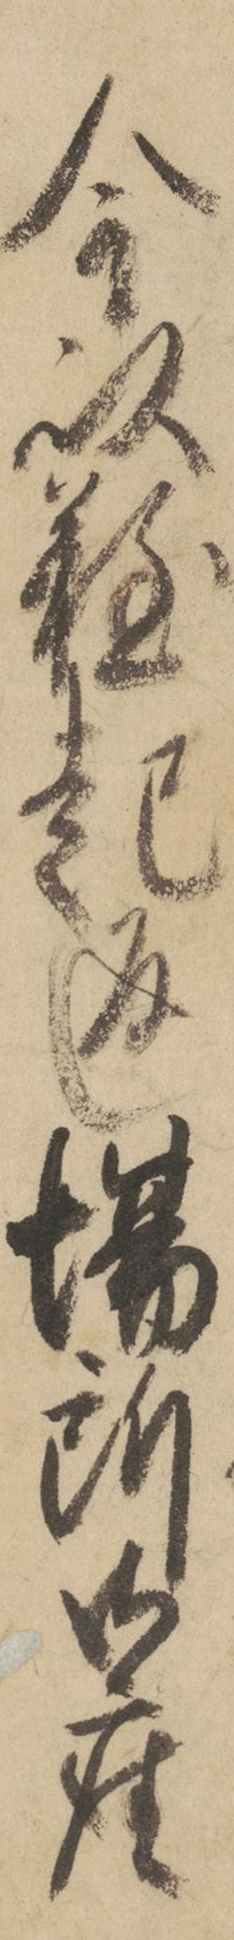今以難起返場所御座
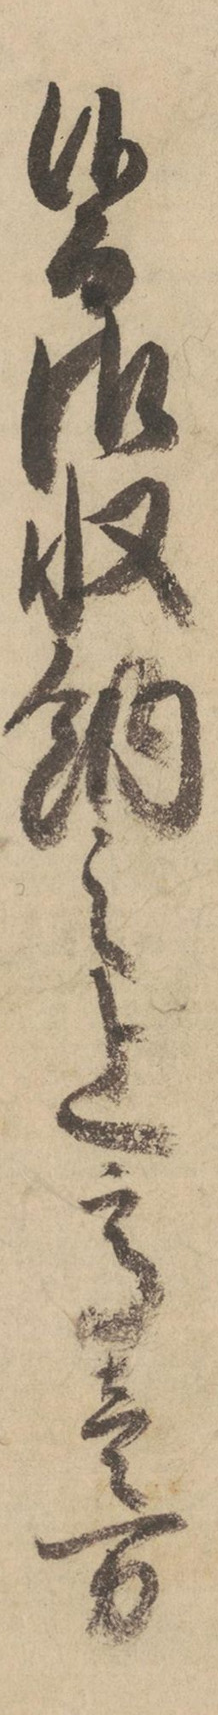候間御収納之上高壱万
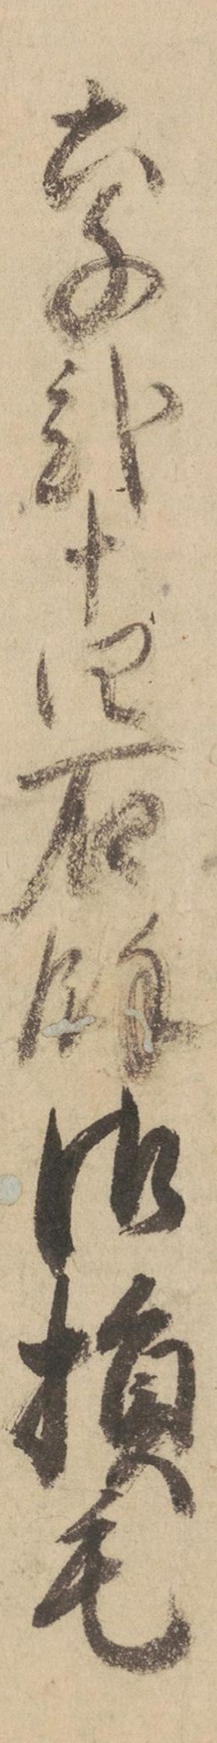六千弐十四石餘御損毛
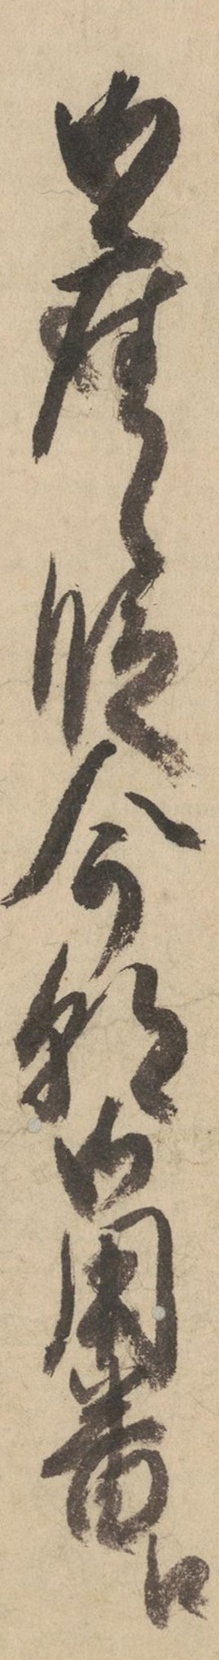御座候段今朝御用番江
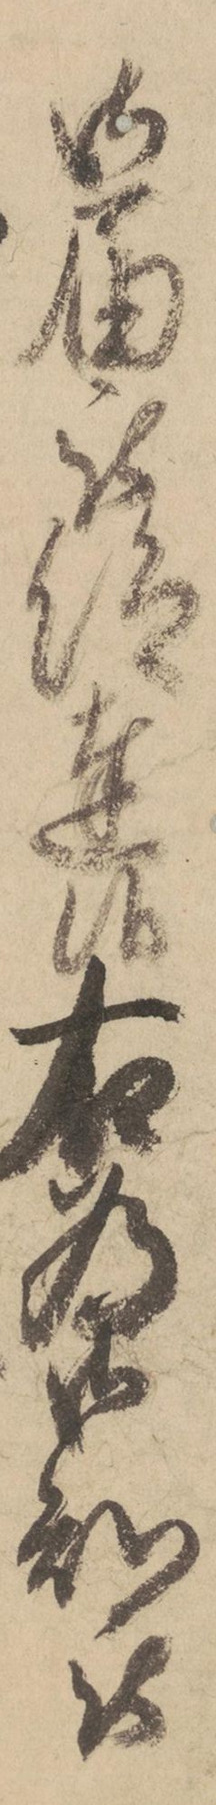御届被仰達候右為御知被
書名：[紀州藩災害記録]
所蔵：東京大学地震研究所図書室 Earthquake Research Institute Library, The University of Tokyo, JAPAN
